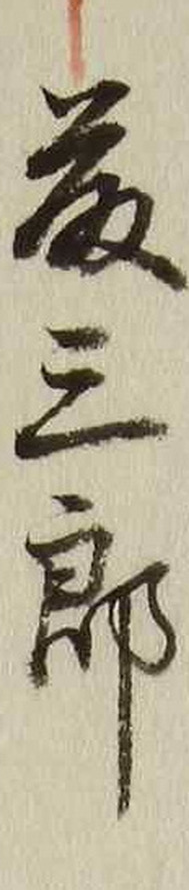藤三郎
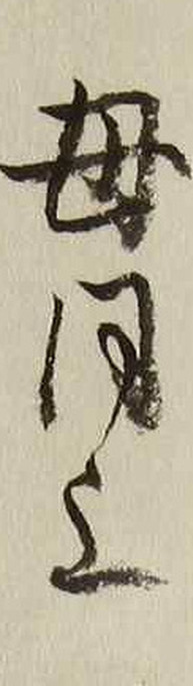母同上
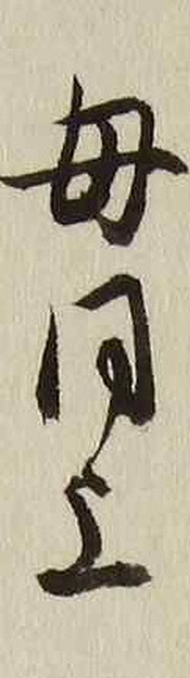母同上
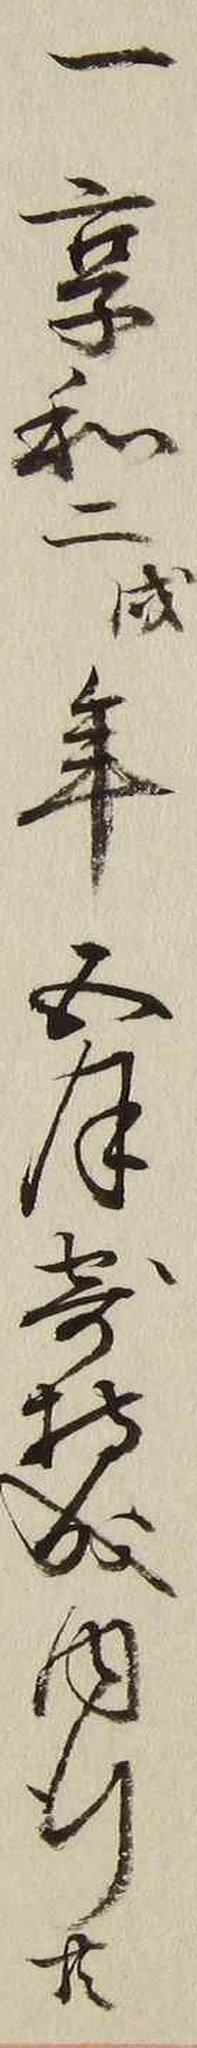一享和二戌年五月寄持成内行共
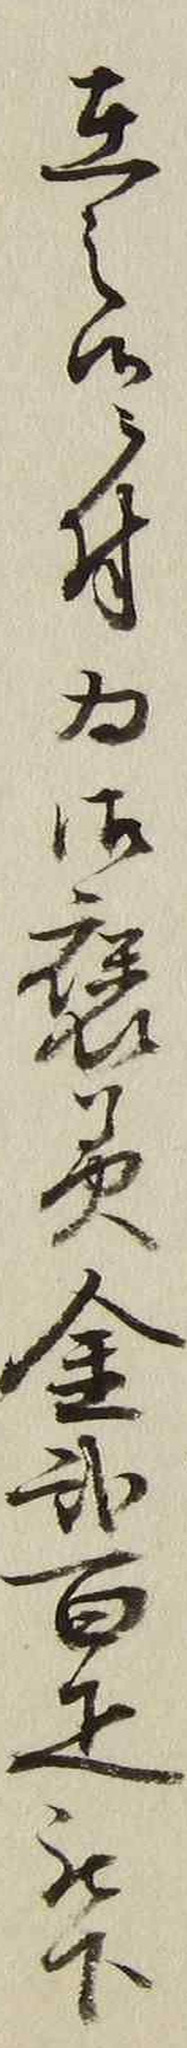在之候ニ付為御褒美金弐百疋被下
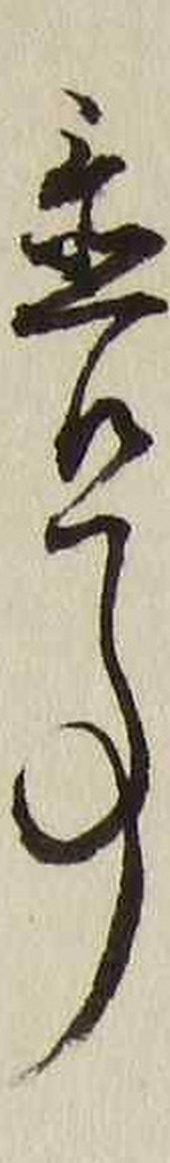置候事

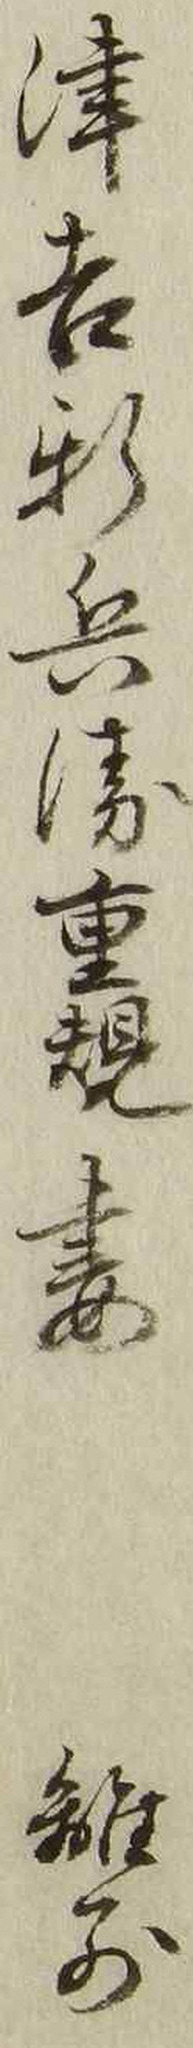女津吉新兵衛重規妻離別
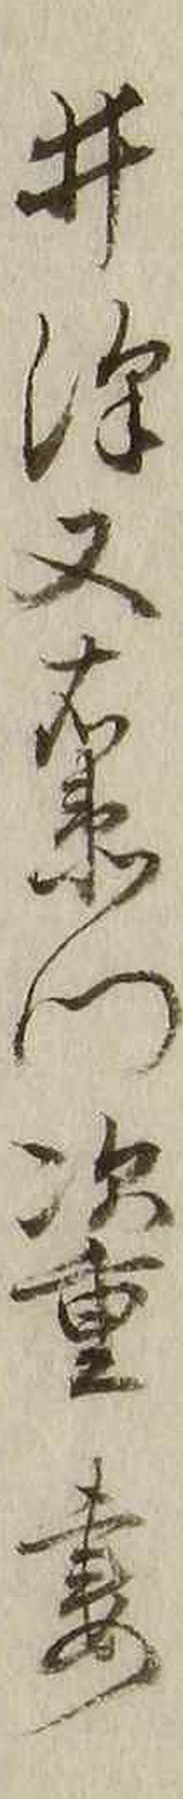井沢又右衛門次重妻
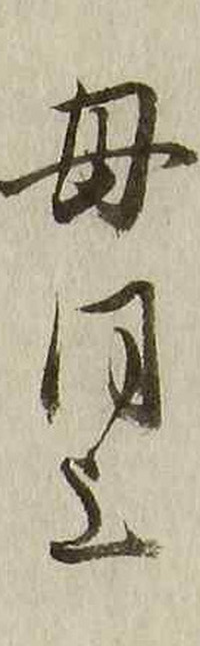母同上
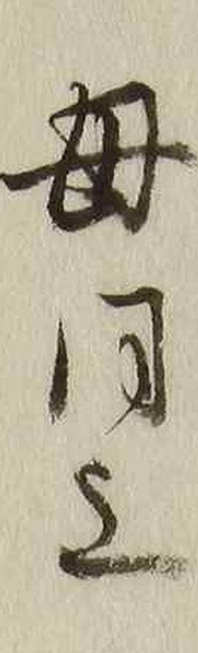母同上
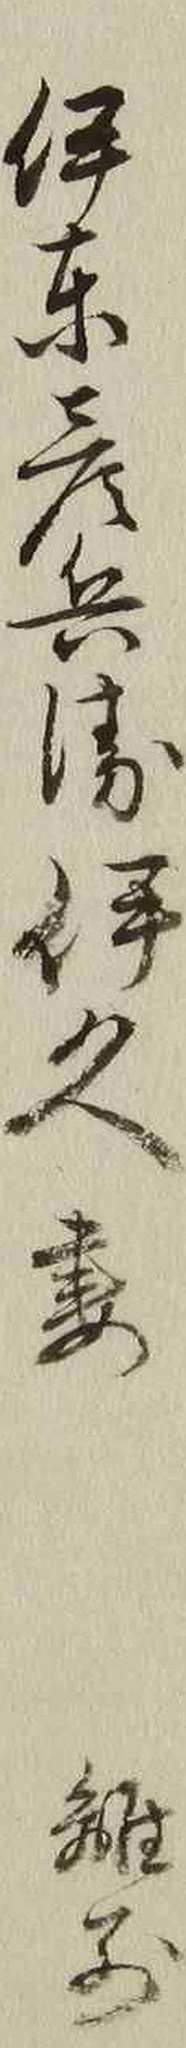女伊東彦兵衛伊久妻離別
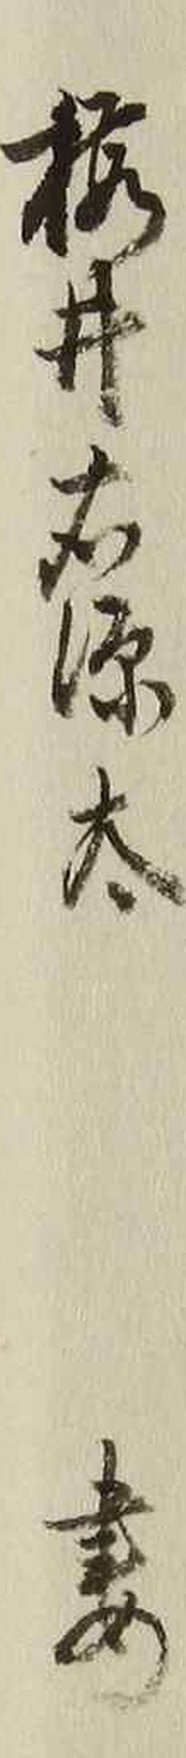桜井右源太妻
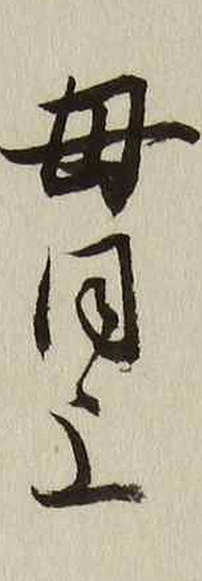母同上
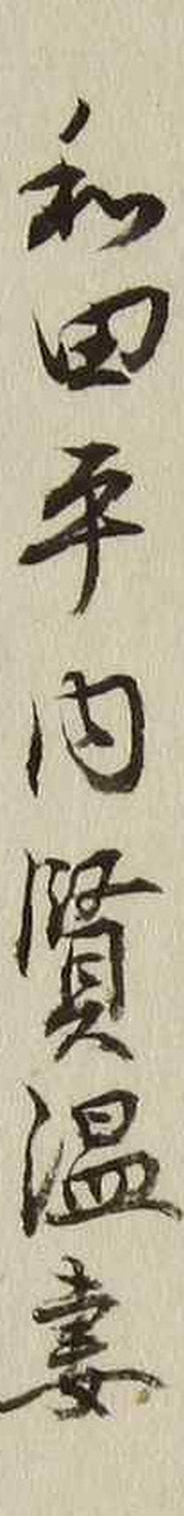和田平内賢温妻
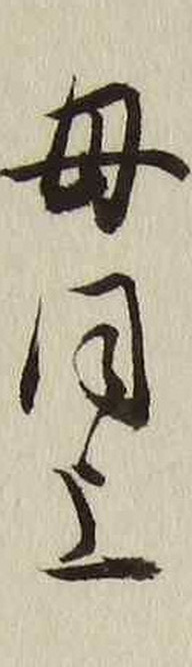母同上
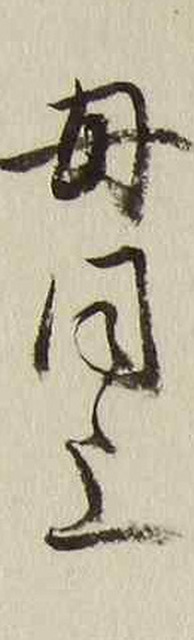母同上
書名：諸士系譜　巻之39　は之部7
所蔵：会津若松市立会津図書館
